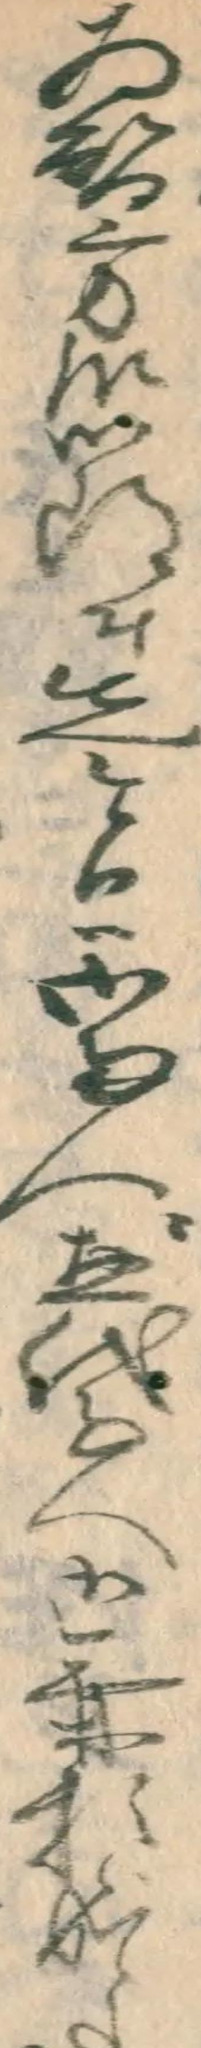為替方故御断ニ付先今日ハ御両人ニ惣代両人御兼頼被成候事
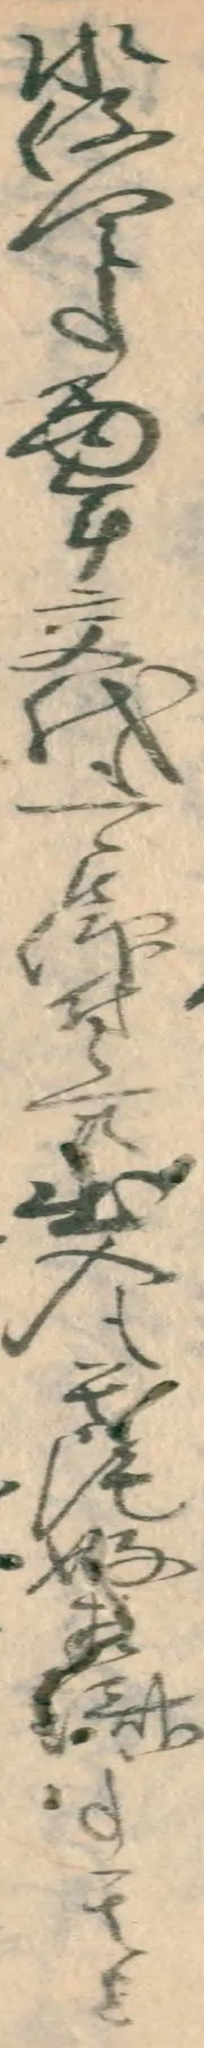一水役人之事当年交代も可被仰付候へ共出入も首尾好相済候事其上
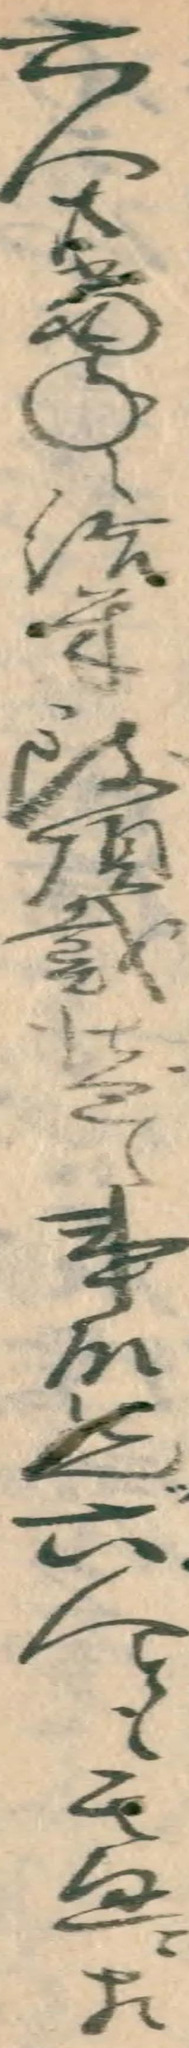六人者当年之給米致頂戴仕廻候事故先ツ六人とも其通ニ相
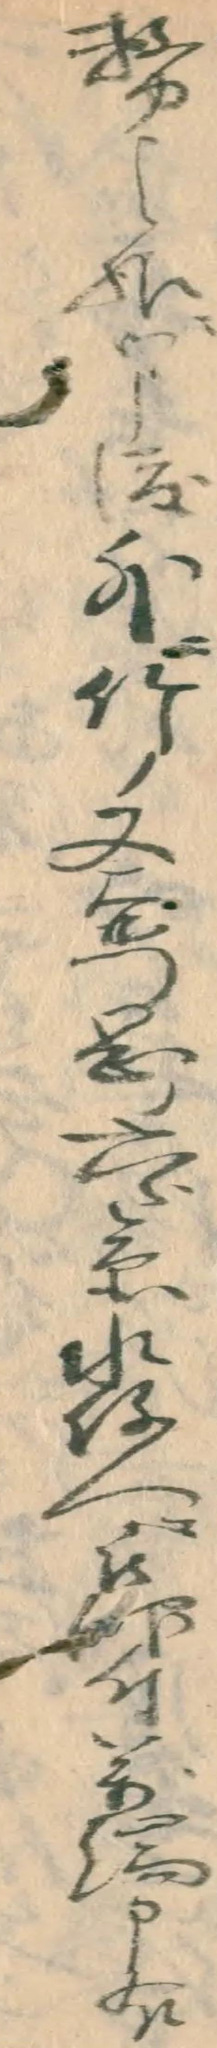務申候様ニ御申渡外ニ竹ノ又左衛門岡ノ六郎兵衛水役人ニ被仰付万端申合
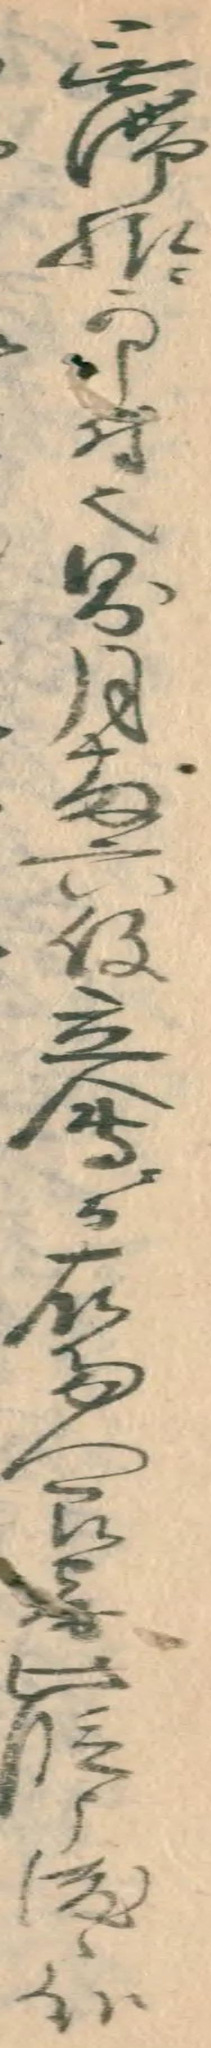無滞様ニ可申付也則月番六役立会ニ而右両人召寄即此段申渡候処
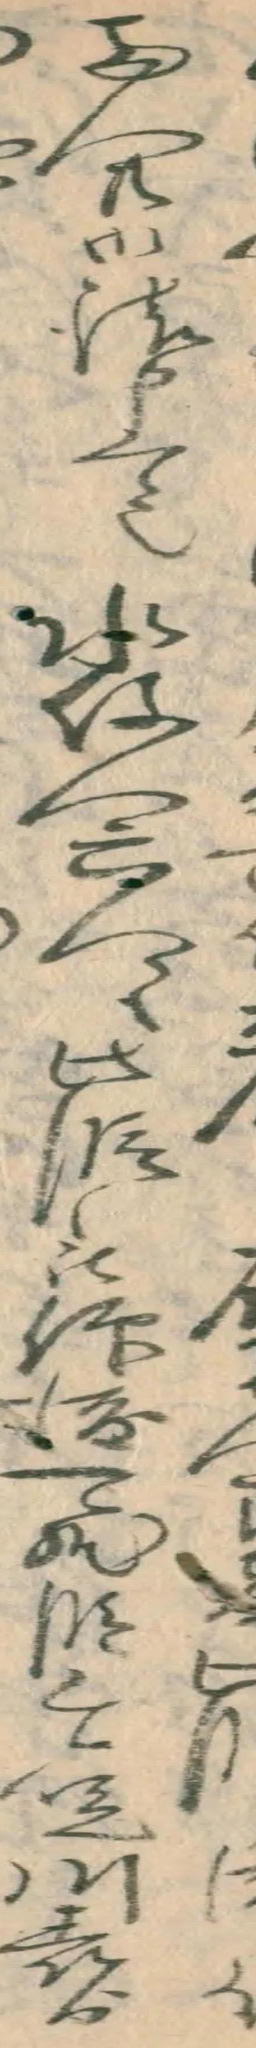両人共御請申上候也水役人六人へも此段被仰渡可然段今晩川表ゟ
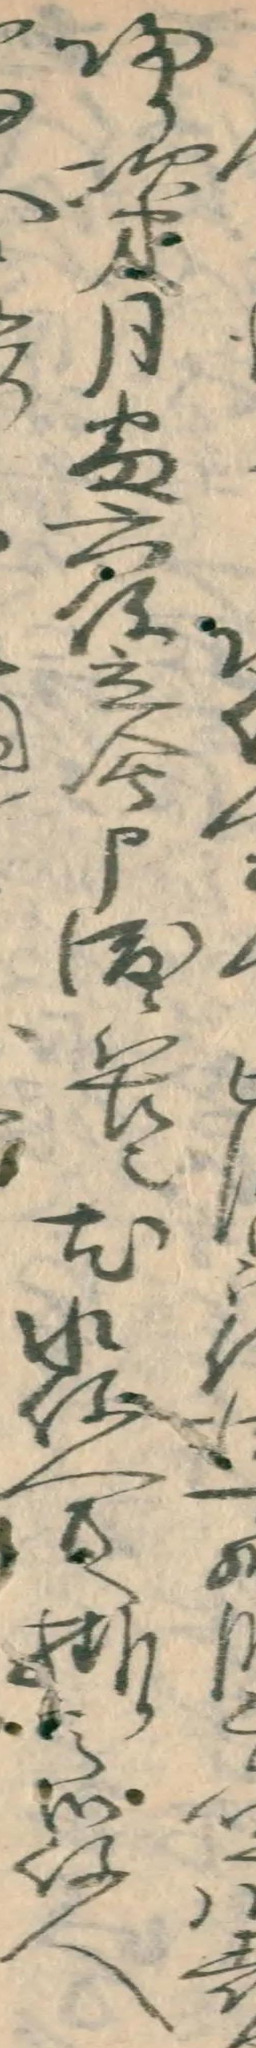帰り次第月番六役立会申渡候筈也尤水役人共へ掛り之御役人
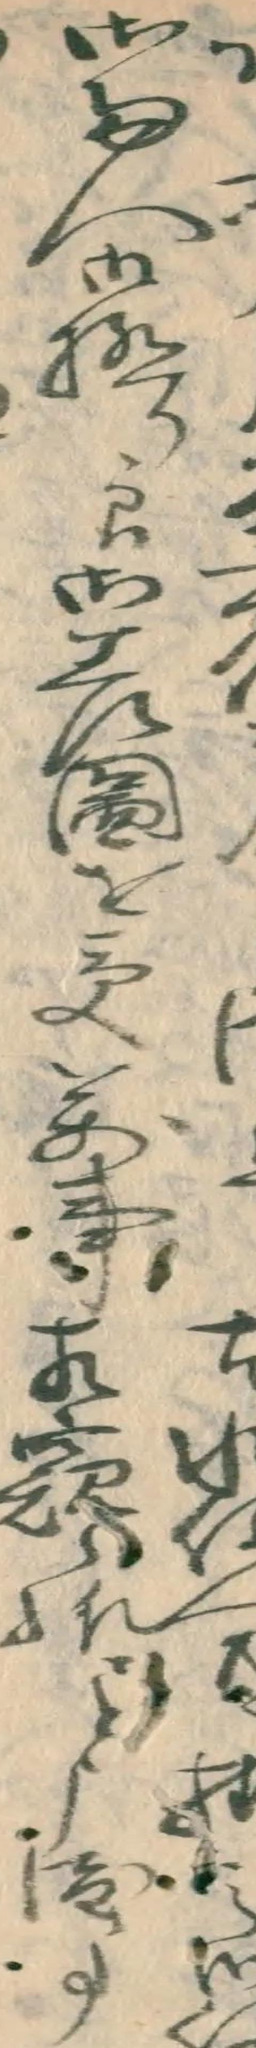御両人御極り候間御差図を受万事相窺候様ニと申渡事
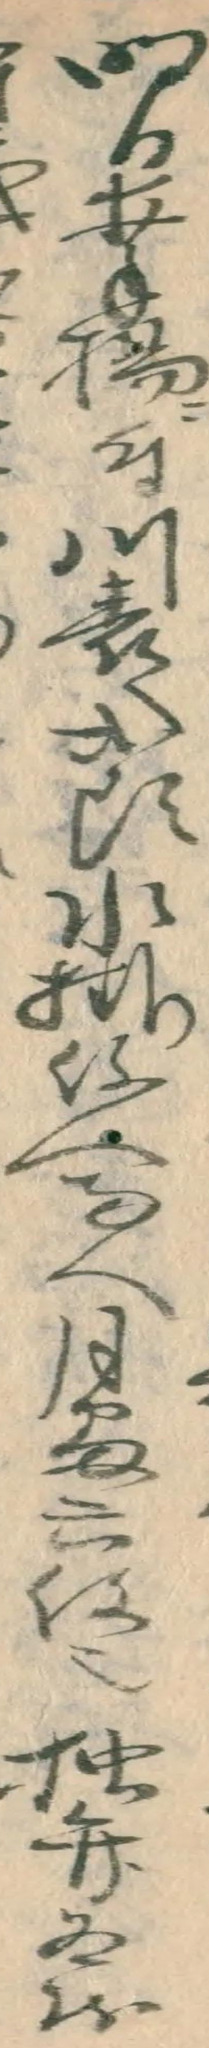一明日井手揚ニ付川表へ出頭水掛役人両人月番六役也独弁為持
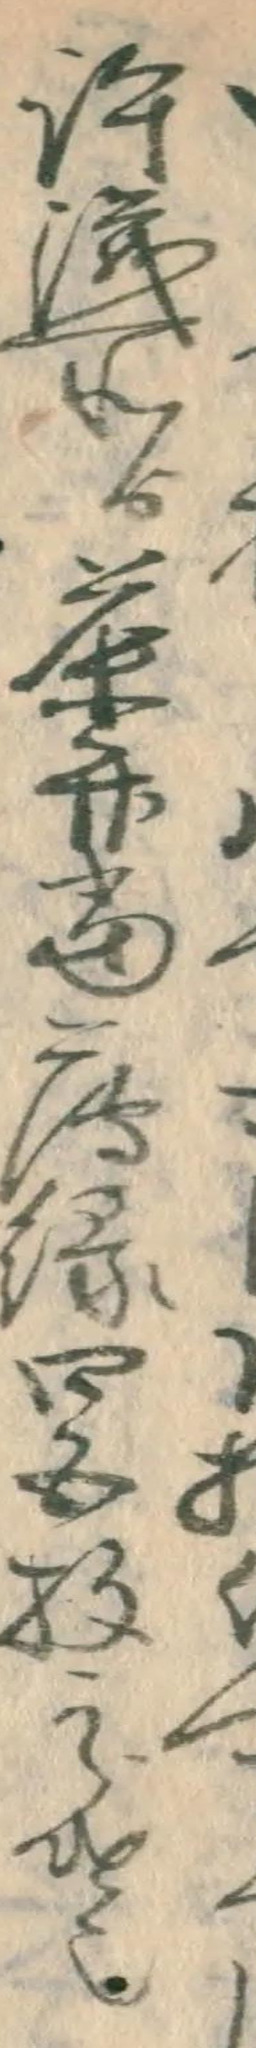評議所ゟ茶弁当薄縁四五枚可被遣也
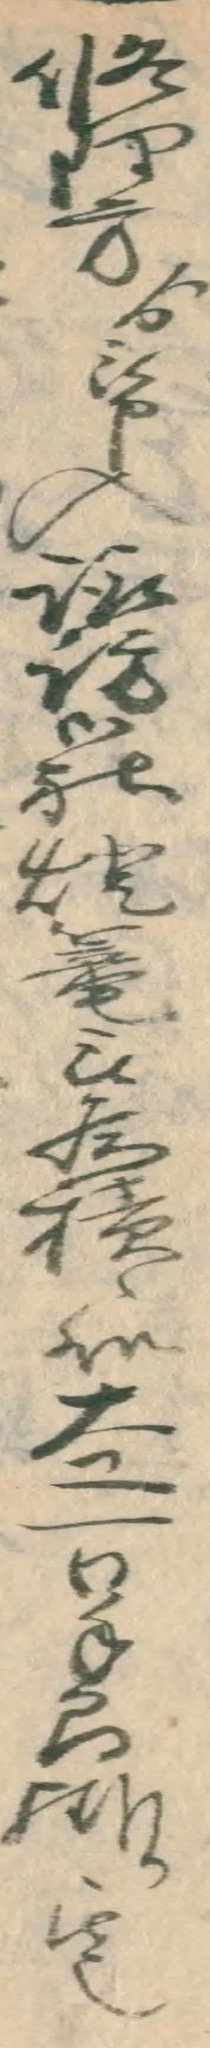一修理方ゟ被申入諏訪御社燈篭被為積候処大工一日手間掛り候由也
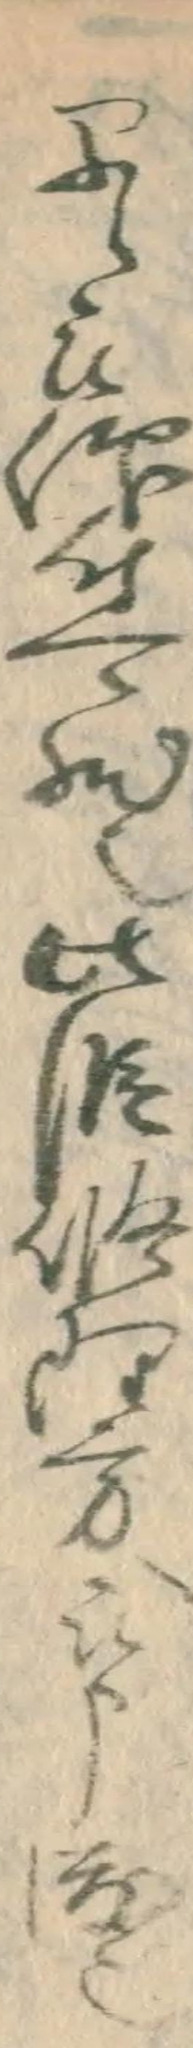早々被仰付可然也此段修理方へ被申渡也
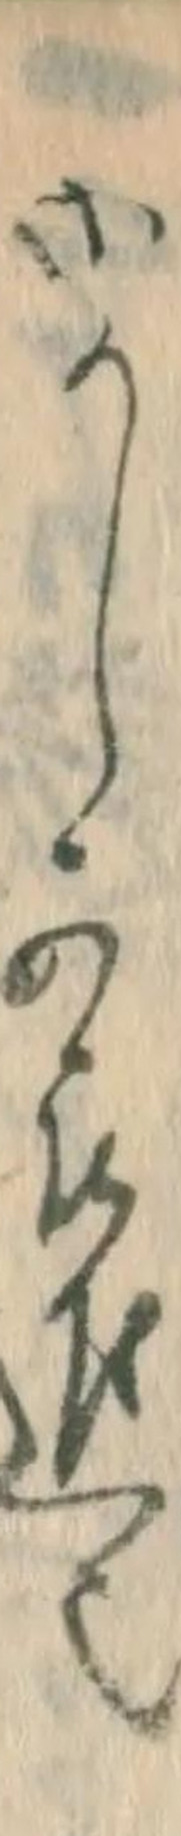御かし可被進也
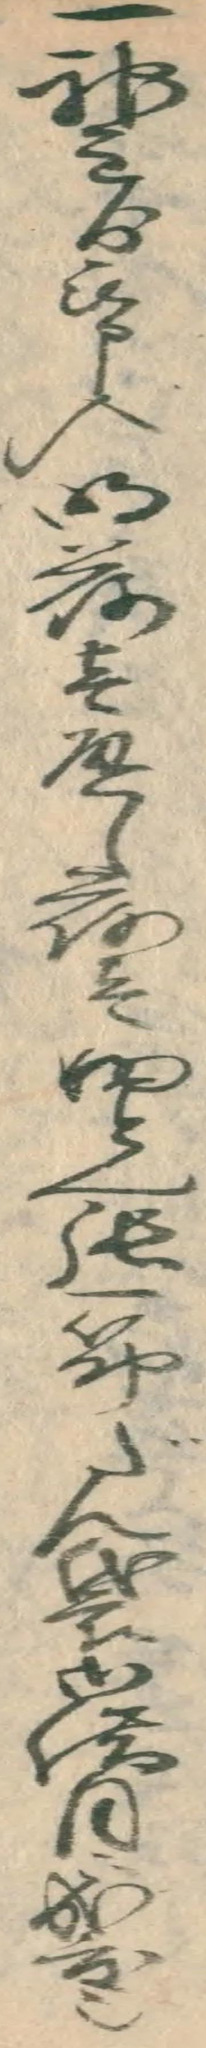一神主ゟ被申入明荷壱通し荷壱ふとん張一筋だん袋御借用ニ成度也
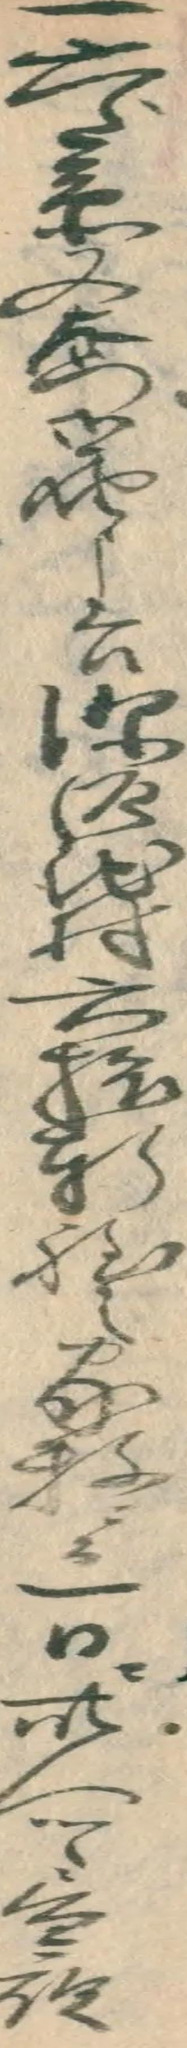一六郎兵衛又左衛門御届申上候深泥池村六拾軒程之家数ニ而一日ニ卅人ツヽ昼夜
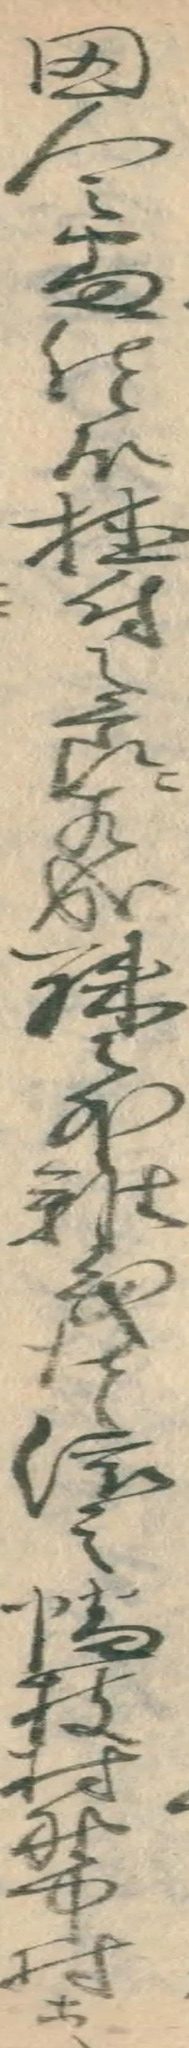囚人之番仕候故植付之節ニ相成殊之外難義仕候依之幡枝村野中村等へ
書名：賀茂社記録. 第58冊
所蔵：国立国会図書館 National Diet Library, JAPAN
